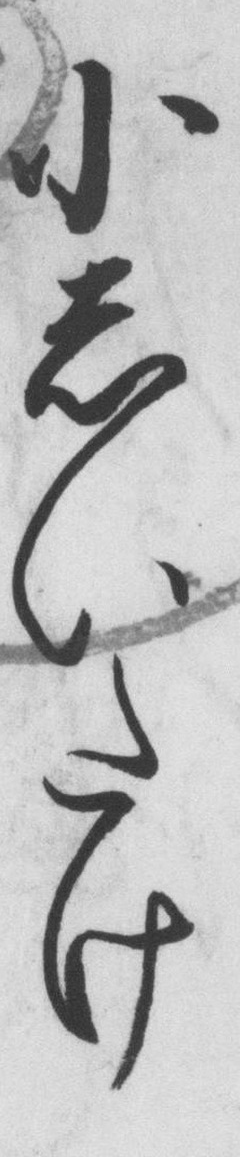小しいたけ
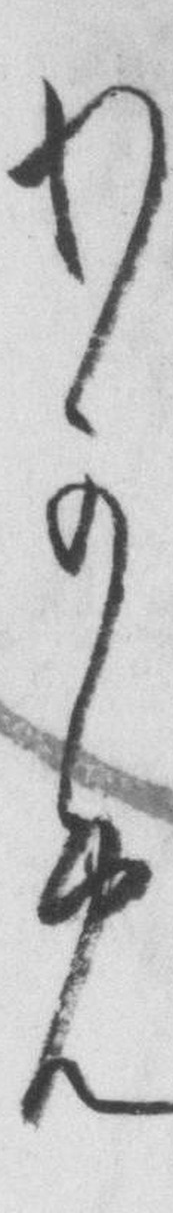ワかめ
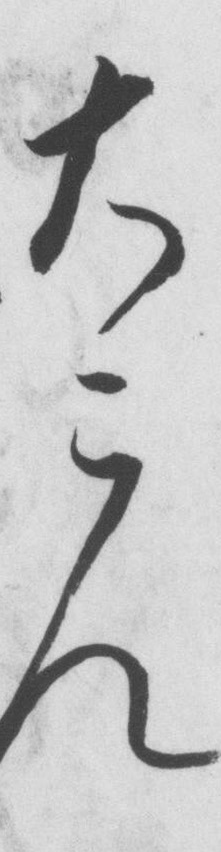大こん
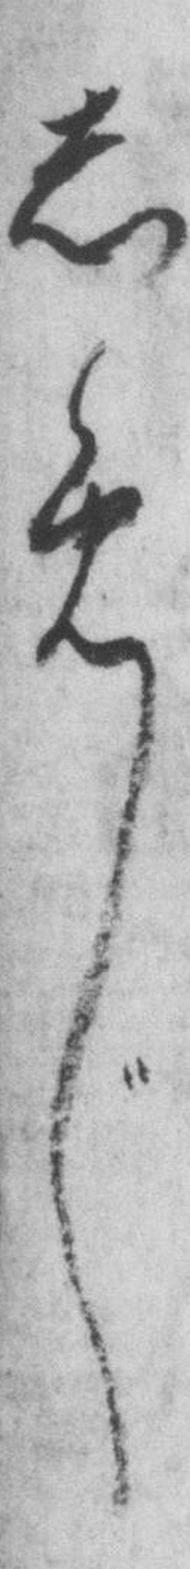しめじ

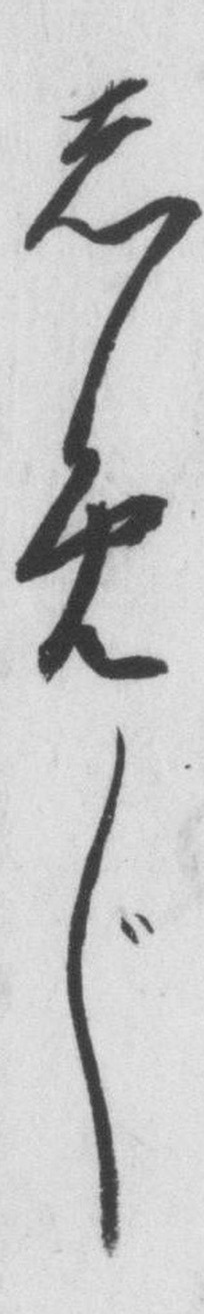しめじ
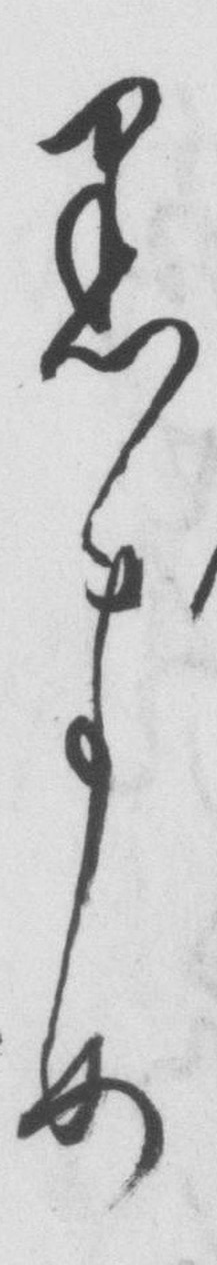黒まめ
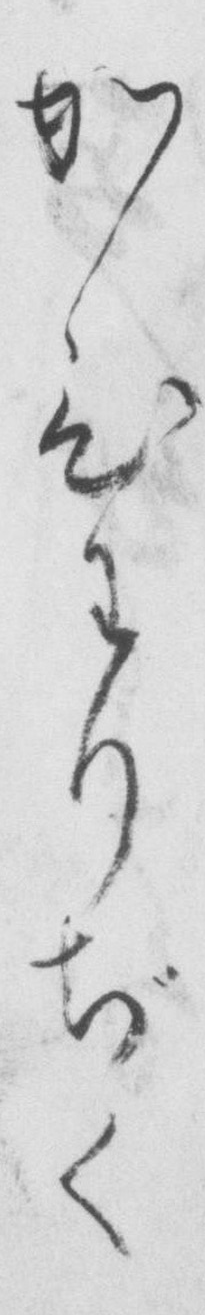かゝひはりぢく
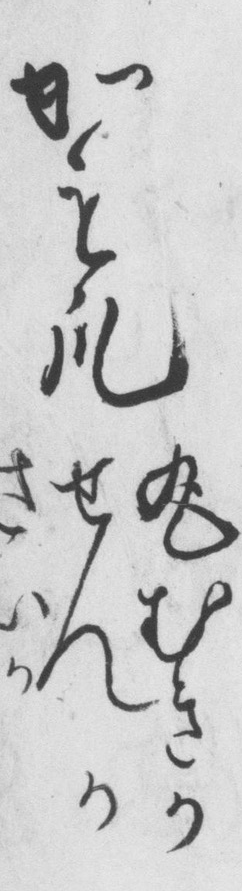かも瓜せんか
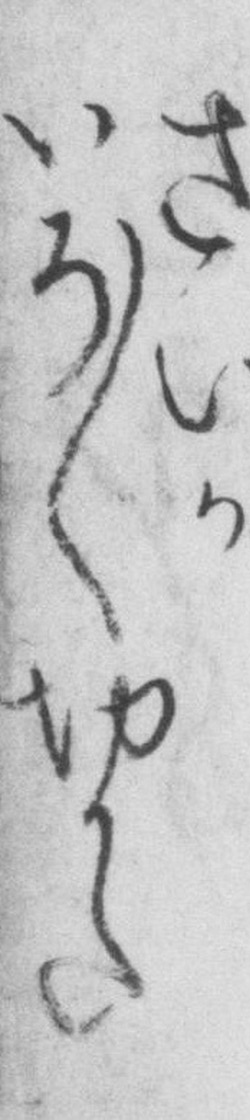いろ〳〵切かた

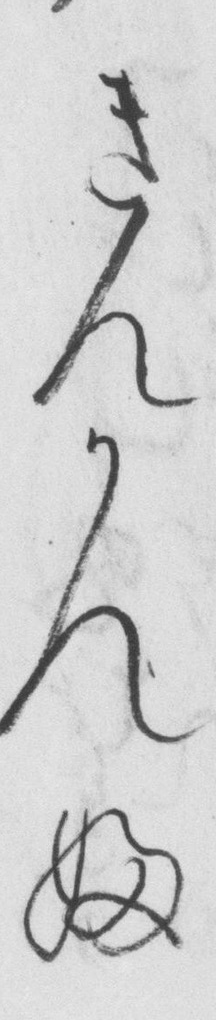きんかんふ
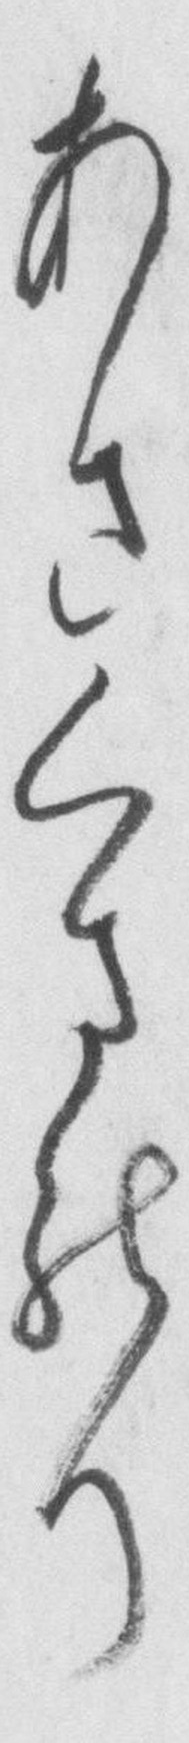あさくさのり
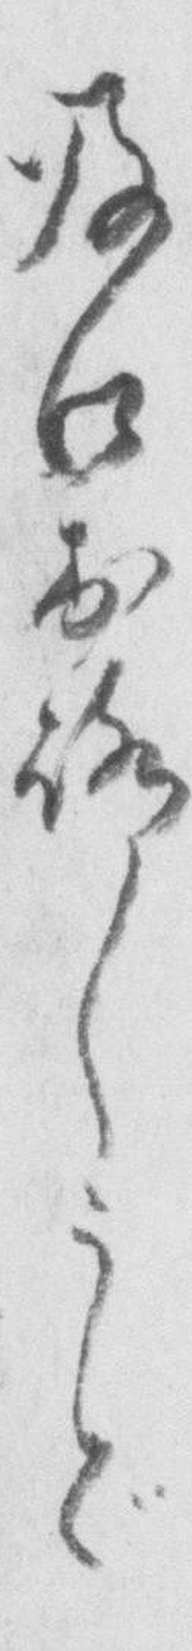吸口お作りうど
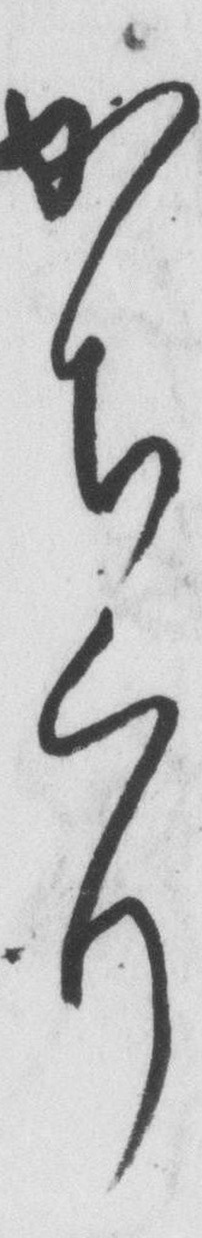かきくり
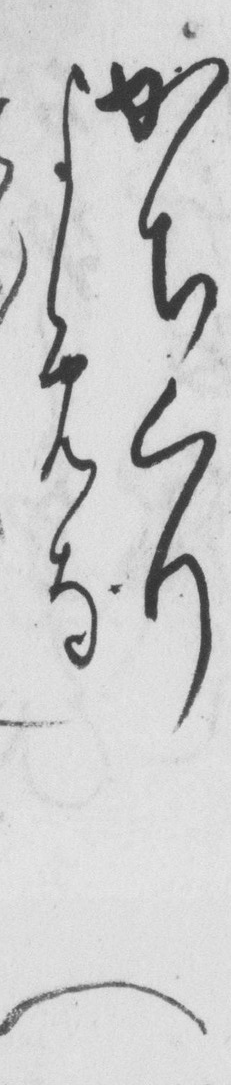かきくり
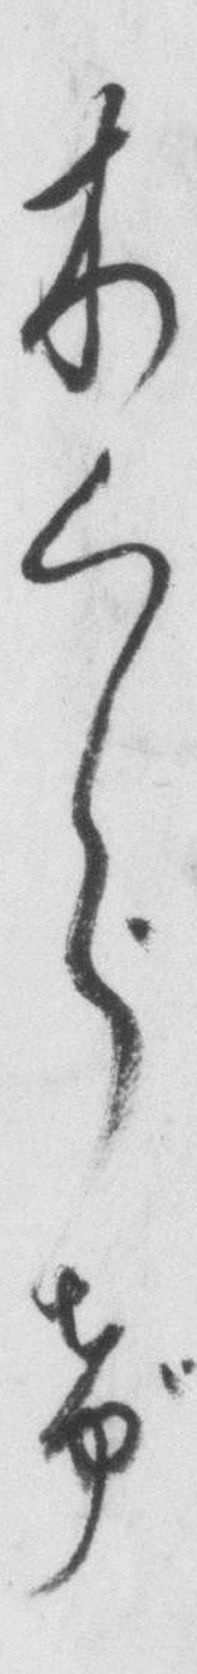木くらげ
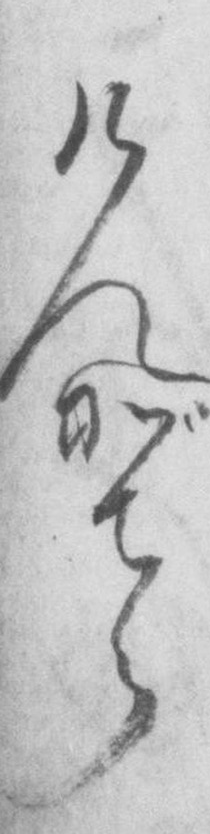けんがてら
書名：料理筌
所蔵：大阪府立大学学術情報センター 国文学研究資料館
